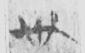卅
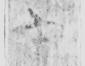七
